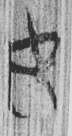女（如）
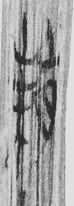薛（櫱）
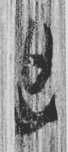足
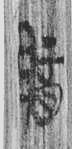𨟻（將）
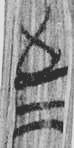至
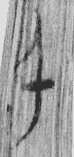千
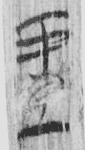里
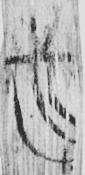必
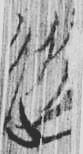從
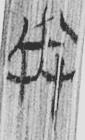灷（寸）
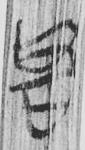○（始）
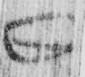日
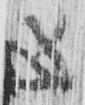之
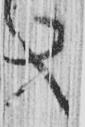又（有）
